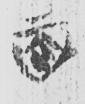百
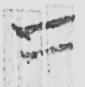二
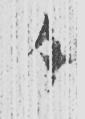千
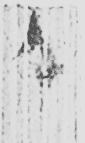千
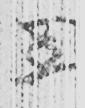五
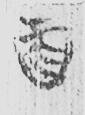百
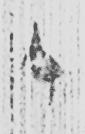千
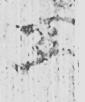五
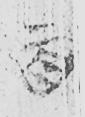百
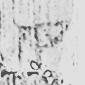四
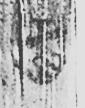百
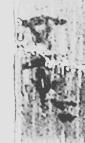五十=
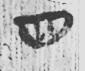四
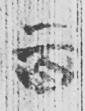百
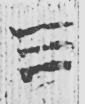三
